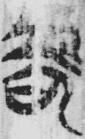唬（乎）
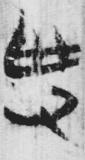拃（作）
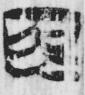爲
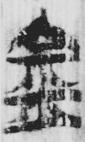金
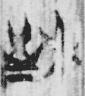桎
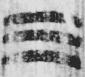三
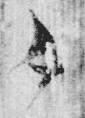千
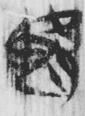既
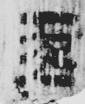爲
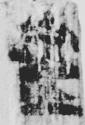金
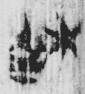桎
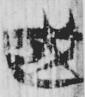或（又）
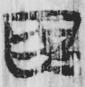爲
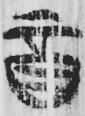酉（酒）
